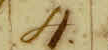4.
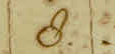8.
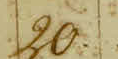20.
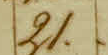21.
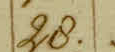28.
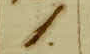1.
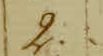2.
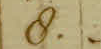8.
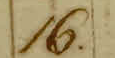16.
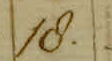18.
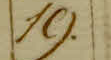19.
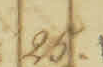25
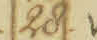28
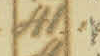41
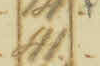41.
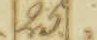25
